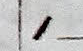1
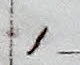1
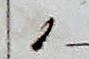1
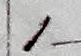1
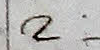2
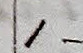1
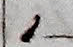1
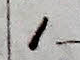1
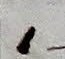1
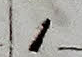1
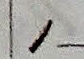1
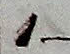1
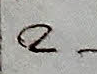2
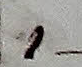1
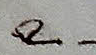2
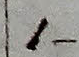1
